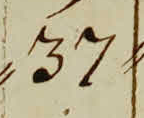37
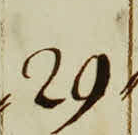29
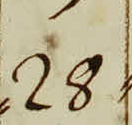28
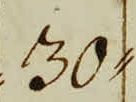30
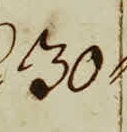30
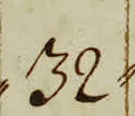32
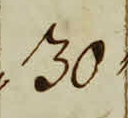30
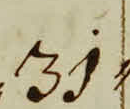31
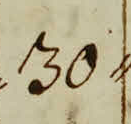30
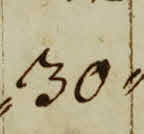30
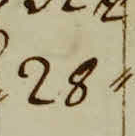28
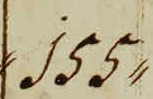155
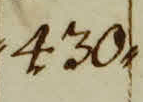430
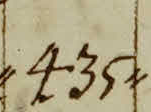435
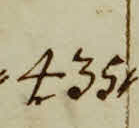435
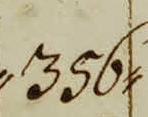356
